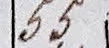55
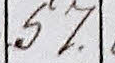57.
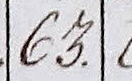63.
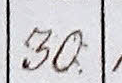30.
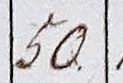50
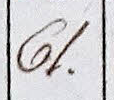61.
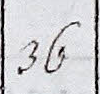36
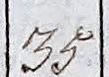35
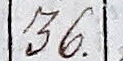36.
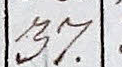37.
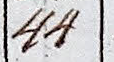44
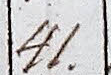41.
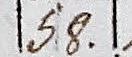58.
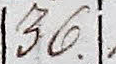36.
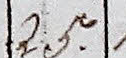25.
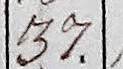37.
